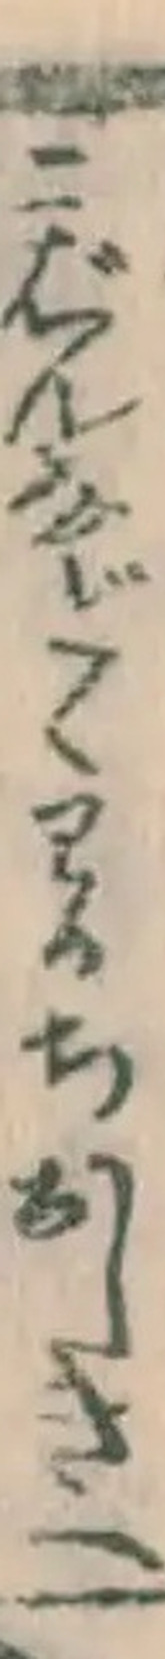二ばんなどゝわかちおしきへ
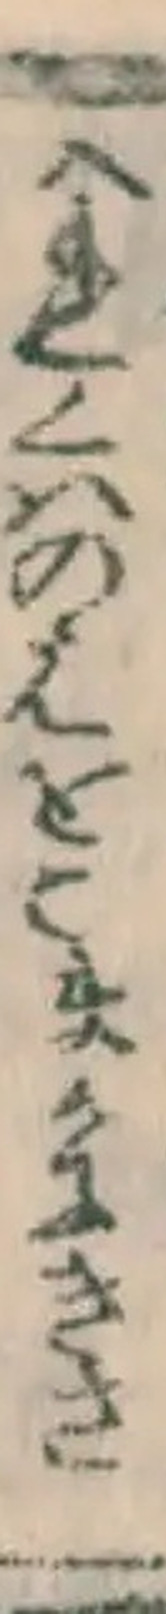入れくはのはをこまかにきさ
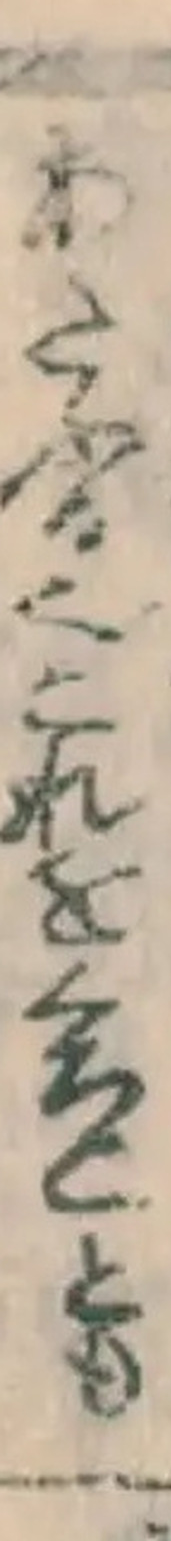あたふる也これをくろことも
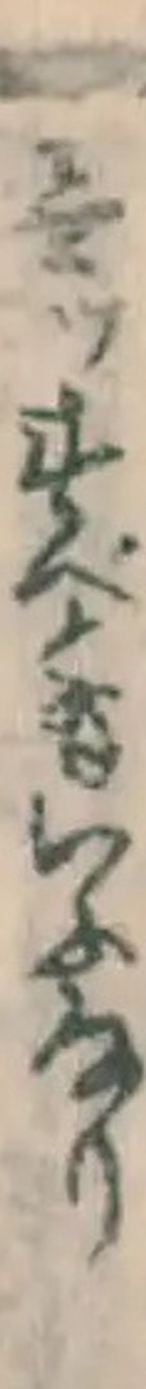壱ツすべともいふなり
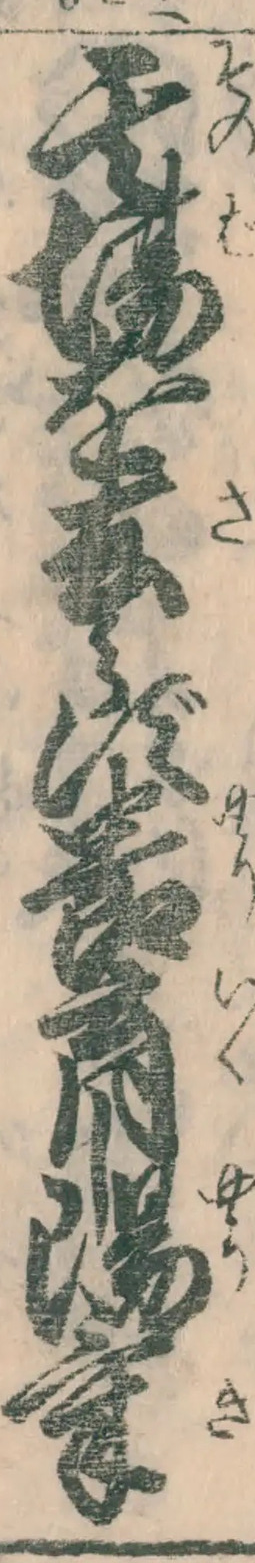其場を去らず養育陽気

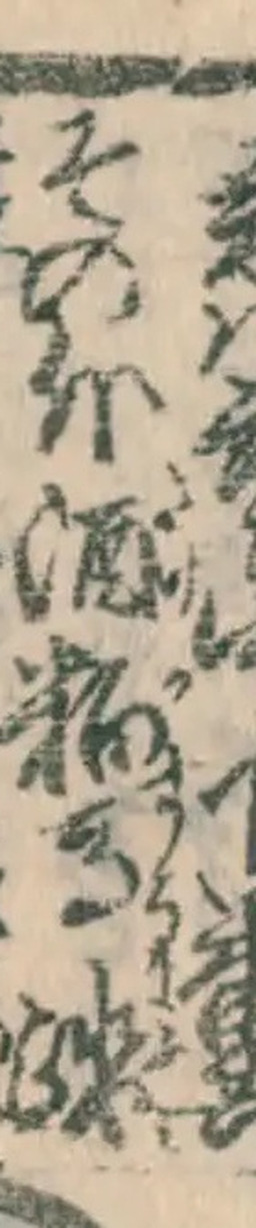その外酒粕馬踏
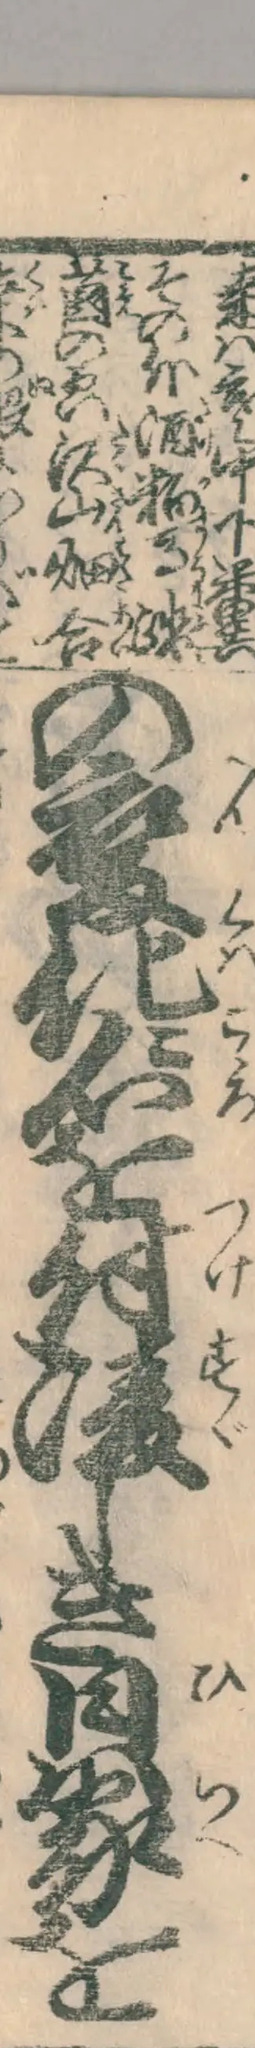の変化に心を付凌しき日は家を
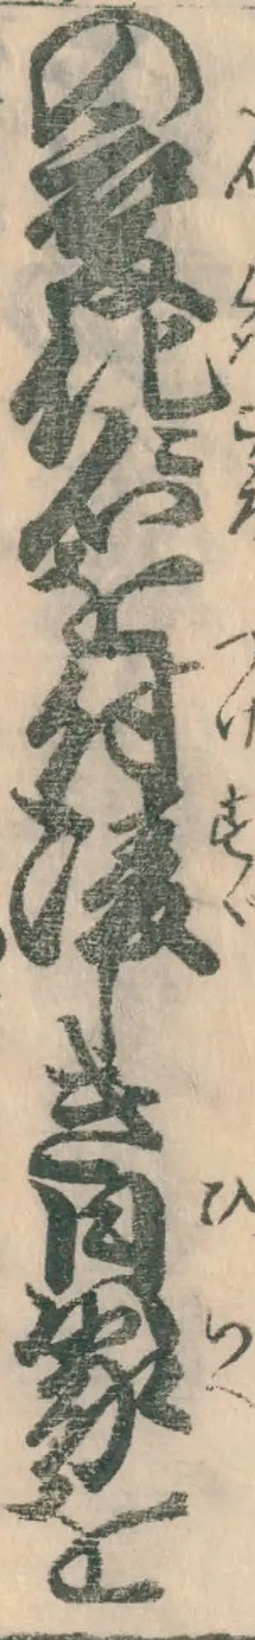の変化に心を付凌しき日は家を
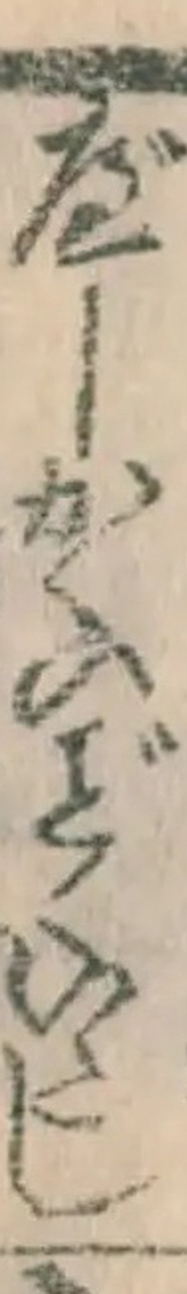べしかくのごとくいたし
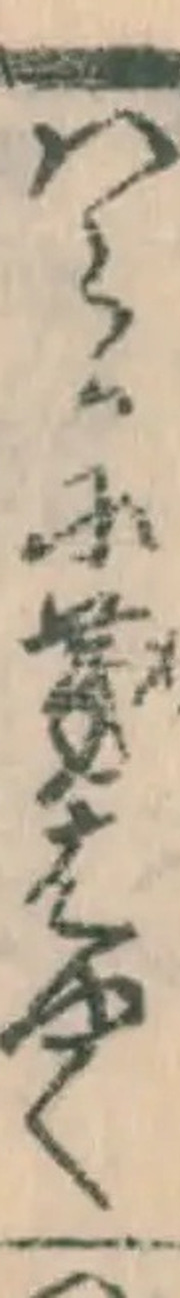はらかに芽はやく
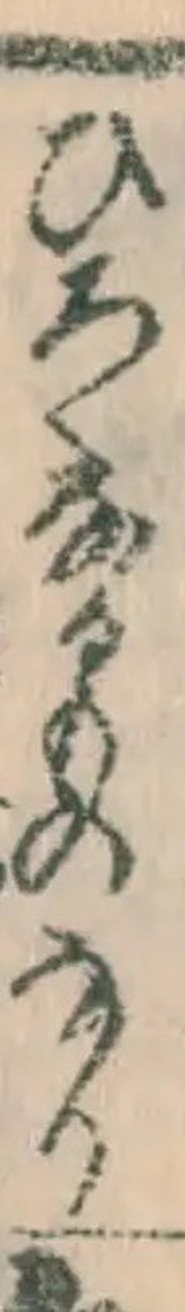ひろくなるものなり
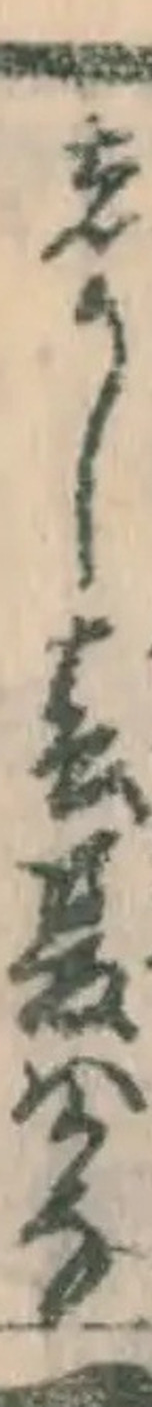しかし春夏はかな
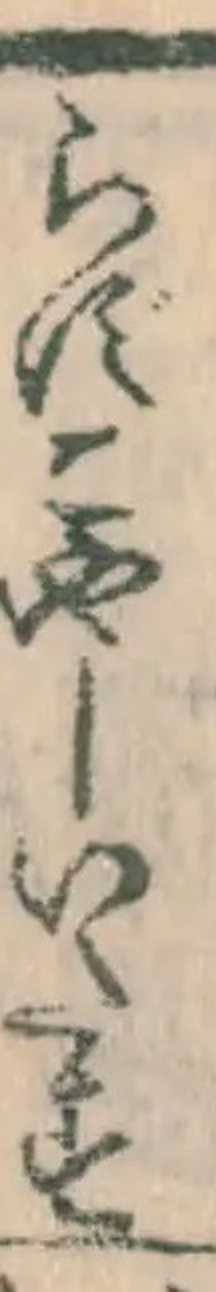らずこやしいたす
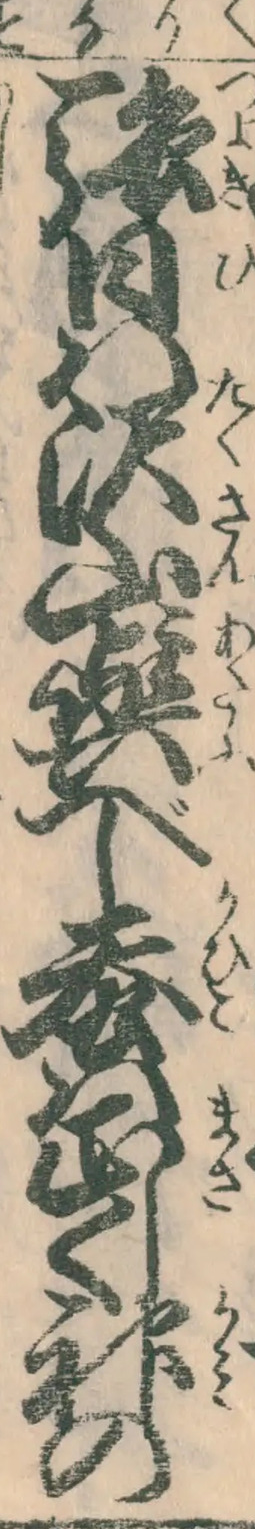強日は沢山與べし蚕は正しく神の
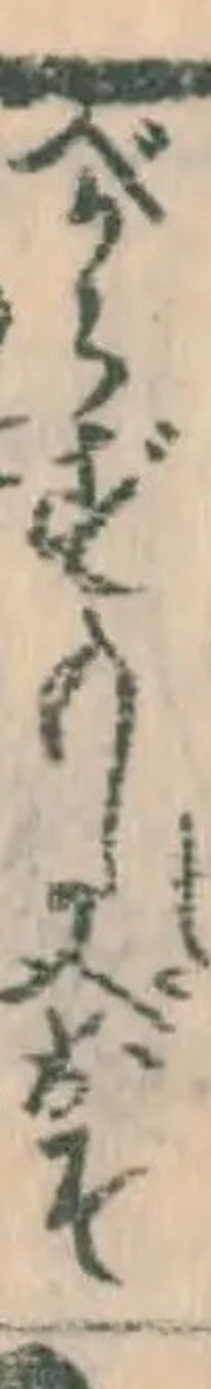べからずもし又おそ
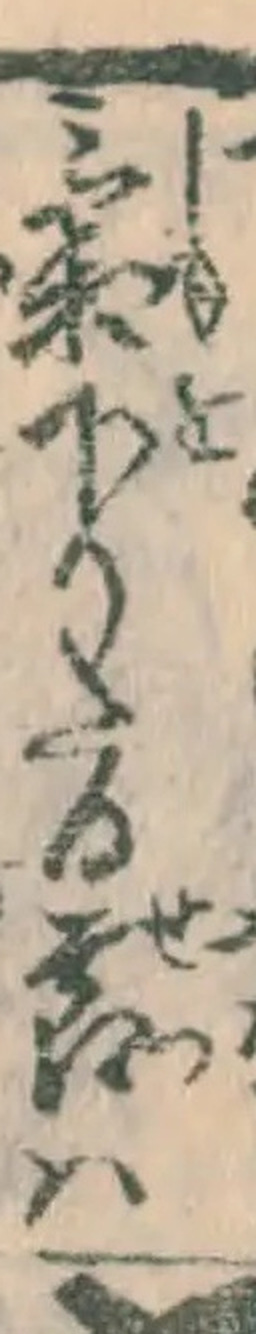霜下りたる節は
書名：養蚕往来
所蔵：国立国会図書館 National Diet Library, JAPAN
